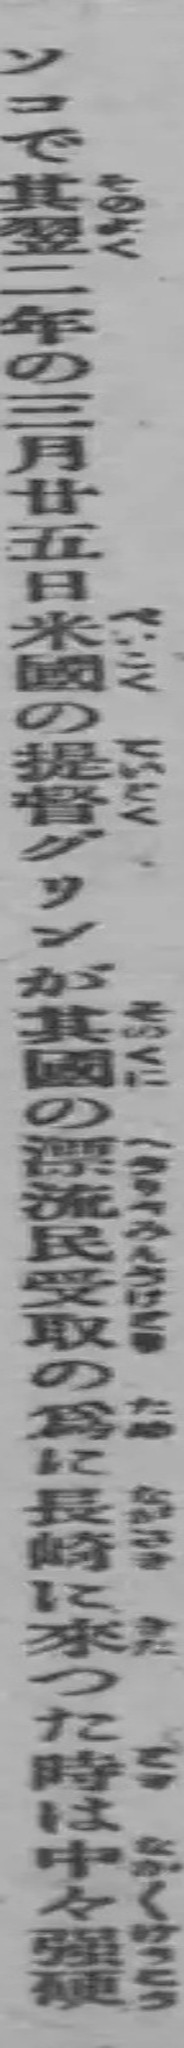ソコで其翌二年の三月廿五日米国の提督グリンが其国の漂流民受取の為に長崎に来つた時は中々強硬
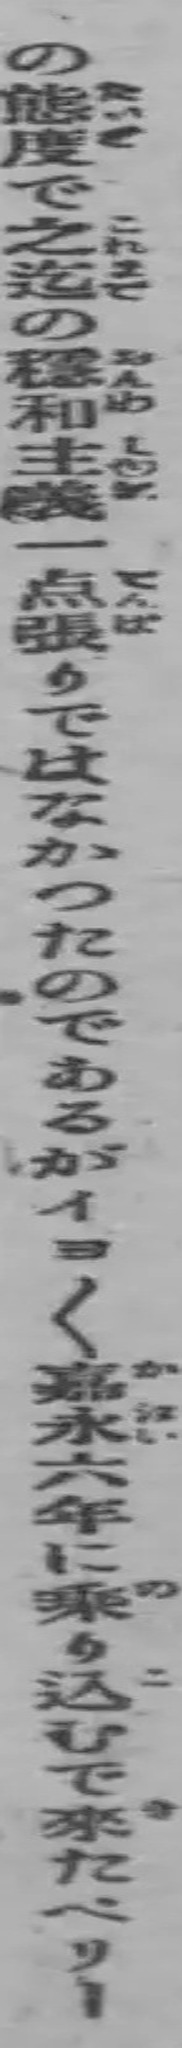の態度で之迄の穏和主義一点張りではなかつたのであるがイヨ〳〵嘉永六年に乗り込むで来たペリー
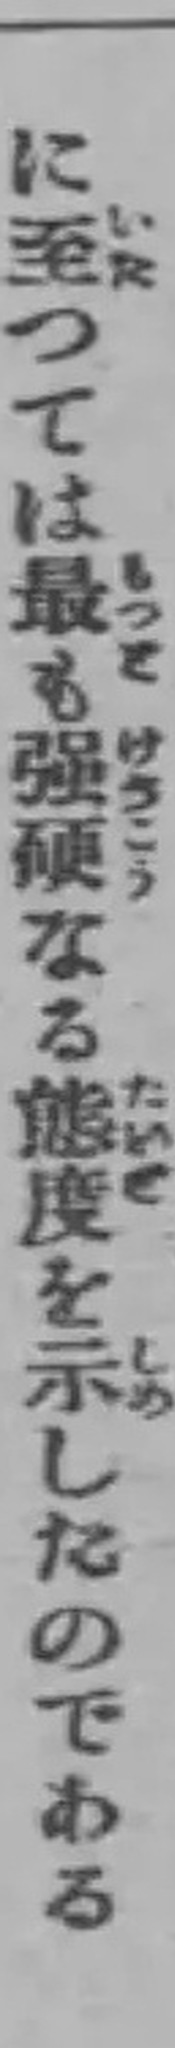に至つては最も強硬なる態度を示したのである
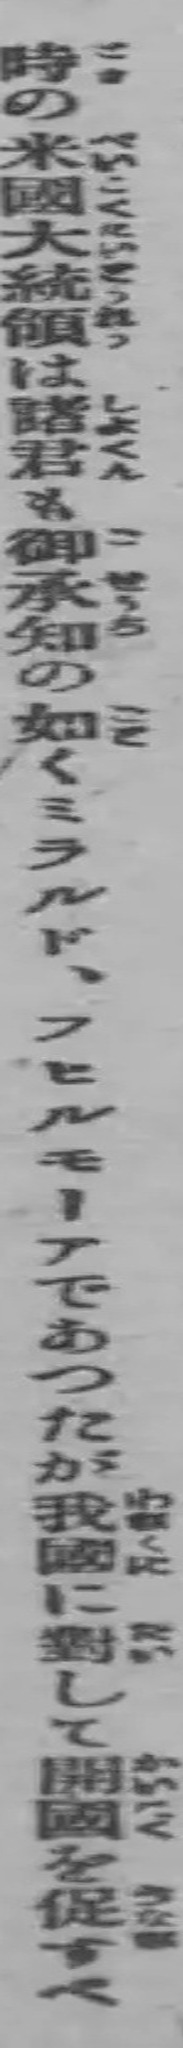時の米国大統領は諸君も御承知の如くミラルド、フヒルモーアであつたが我国に対して開国を促すべ
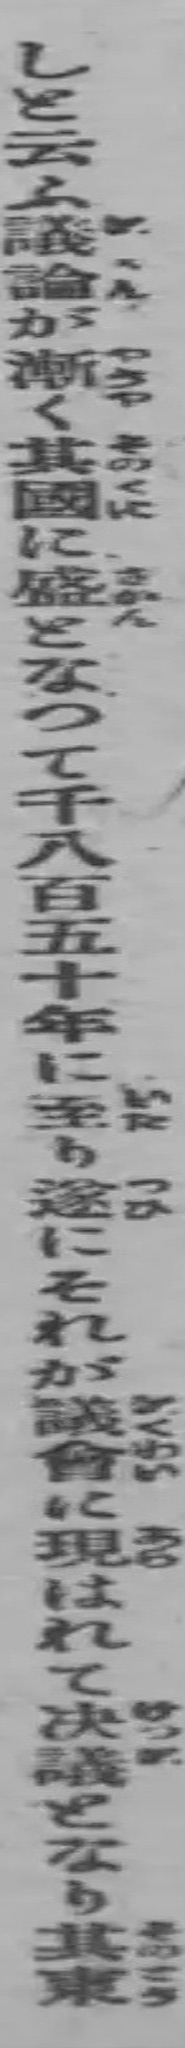しと云ふ議論が漸く其国に盛となつて千八百五十年に至り遂にそれが議会に現はれて決議となり其東
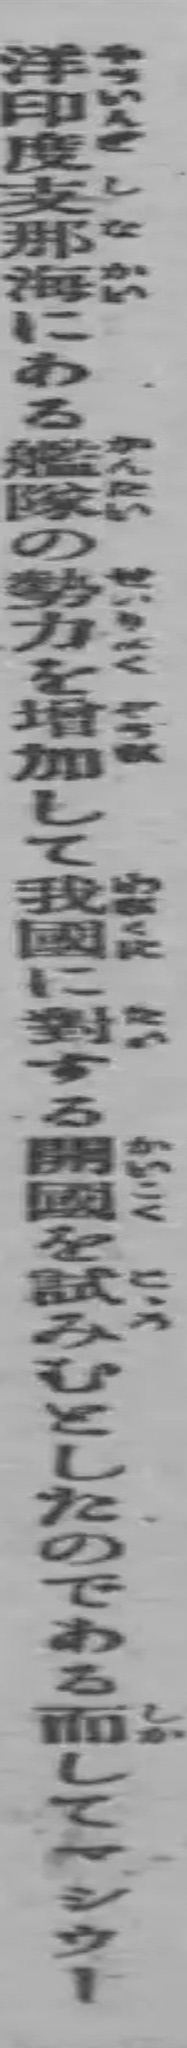洋印度支那海にある艦隊の勢力を増加して我国に対する開国を試みむとしたのである而してマシウー
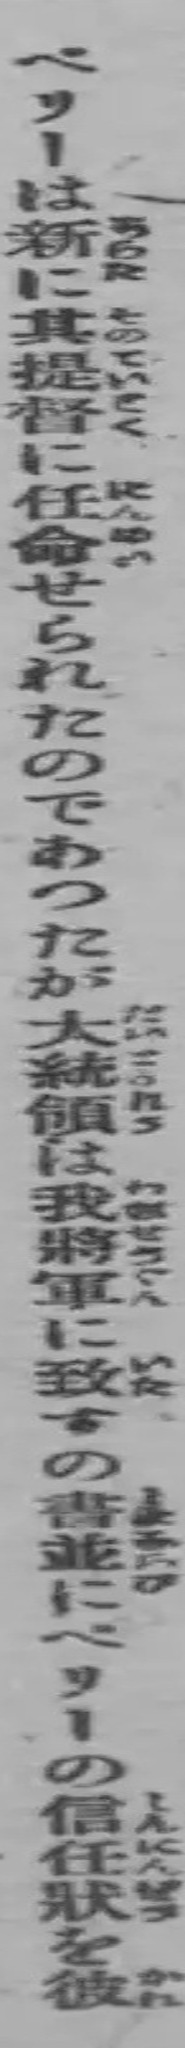ペリーは新に其提督に任命せられたのであつたが大統領は我将軍に致すの書並にペリーの信任状を彼
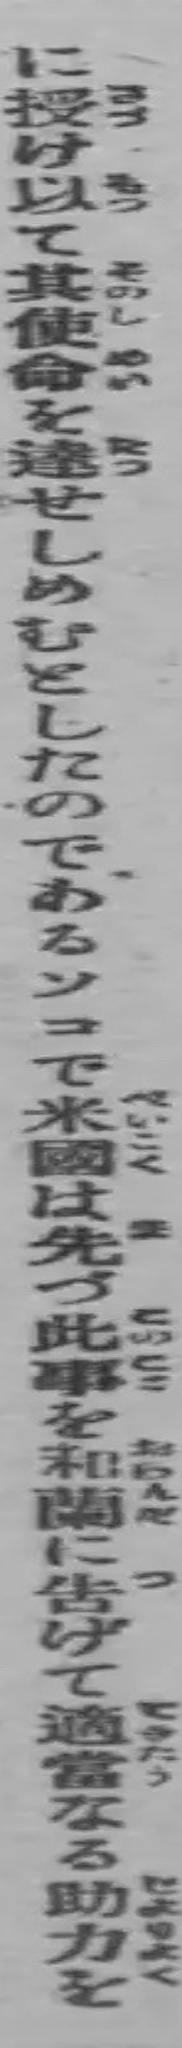に授け以て其使命を達せしめむとしたのであるソコで米国は先づ此事を和蘭に告げて適当なる助力を
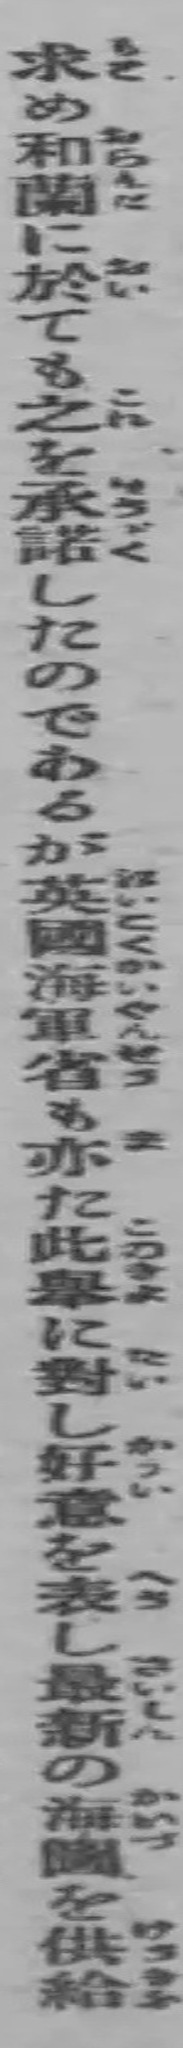求め和蘭に於ても之を承諾したのであるが英国海軍省も亦た此挙に対し好意を表し最新の海図を供給
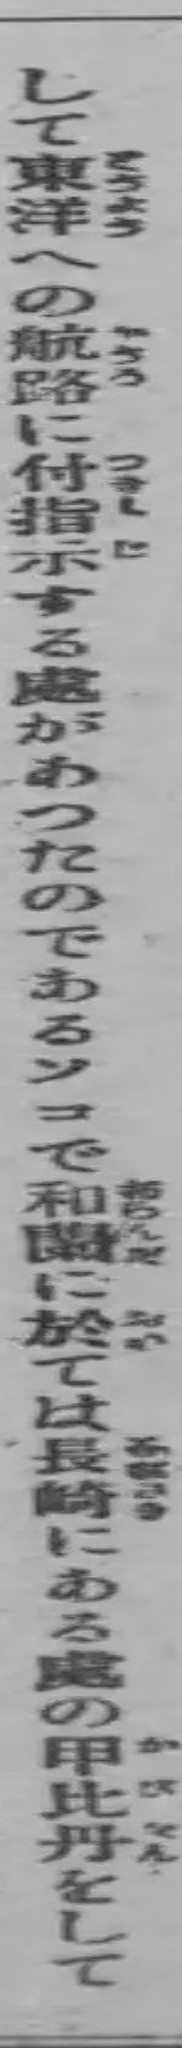して東洋への航路に付指示する処があつたのであるソコで和蘭に於ては長崎にある処の甲比丹をして
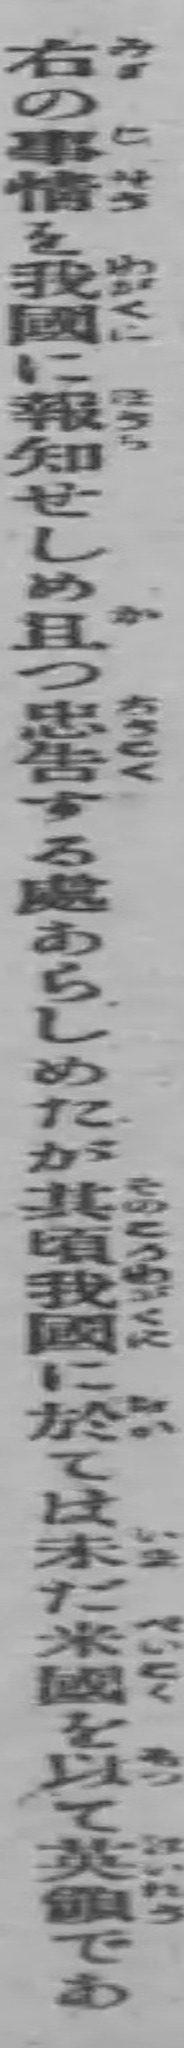右の事情を我国に報知せしめ且つ忠告する処あらしめたが其頃我国に於ては未だ米国を以て英領であ
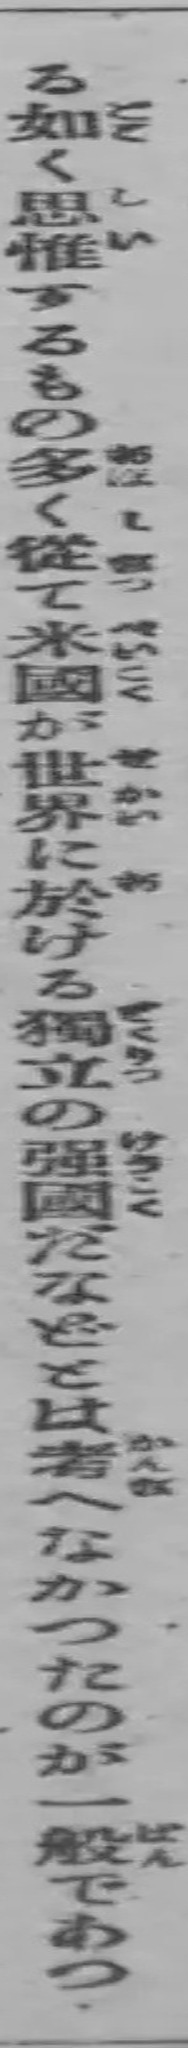る如く思惟するもの多く従て米国が世界に於ける独立の強国だなどとは考へなかつたのが一般であつ
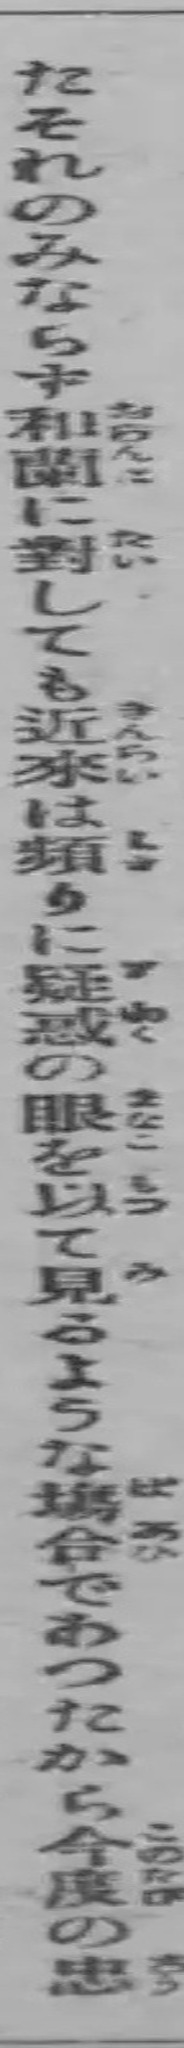たそれのみならず和蘭に対しても近来は頻りに疑惑の眼を以て見るような場合であつたから今度の忠
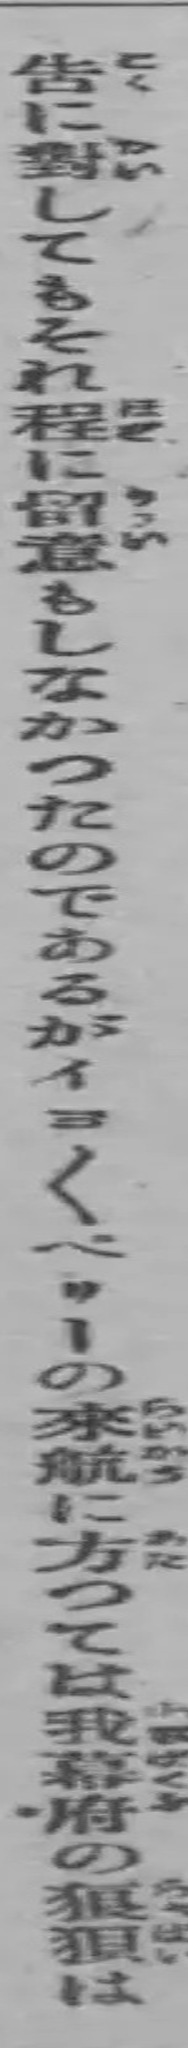告に対してもそれ程に留意もしなかつたのであるがイヨ〳〵ペリーの来航に方つては我幕府の狼狽は
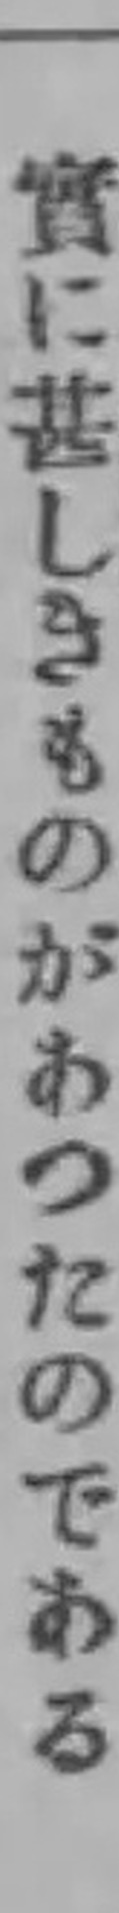実に甚しきものがあつたのである
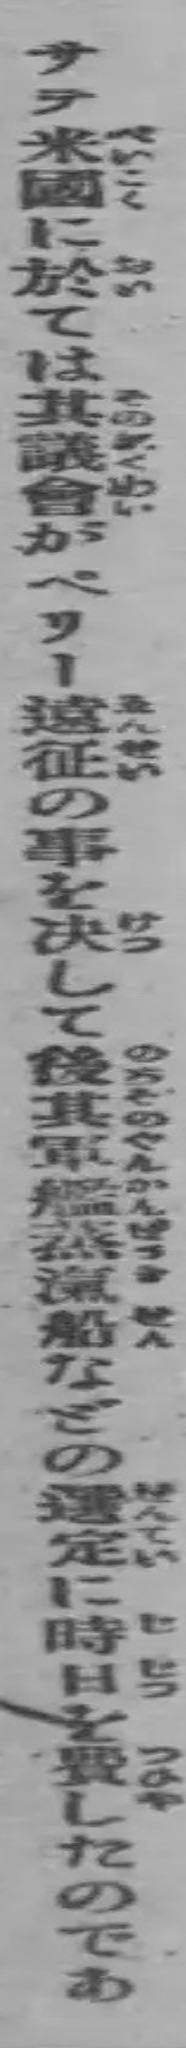サテ米国に於ては其議会がペリー遠征の事を決して後其軍艦蒸滊船などの選定に時日を費したのであ
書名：豊橋市史談
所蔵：国立国会図書館 National Diet Library, JAPAN
